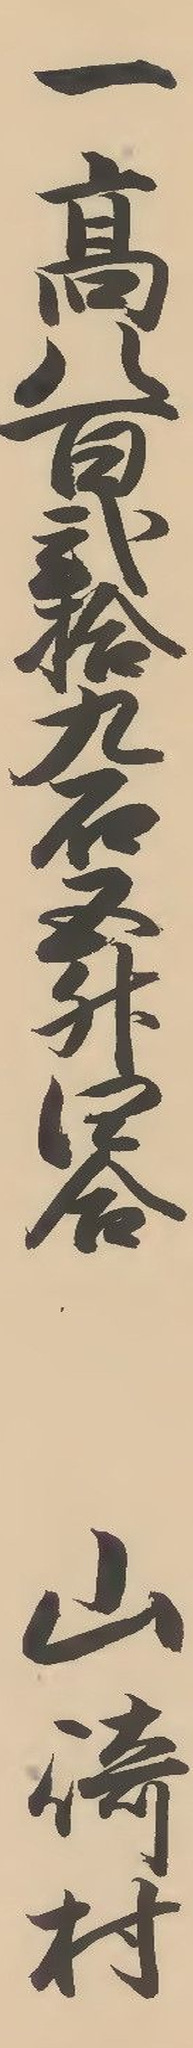一髙八百弐拾九石五升四合山崎村
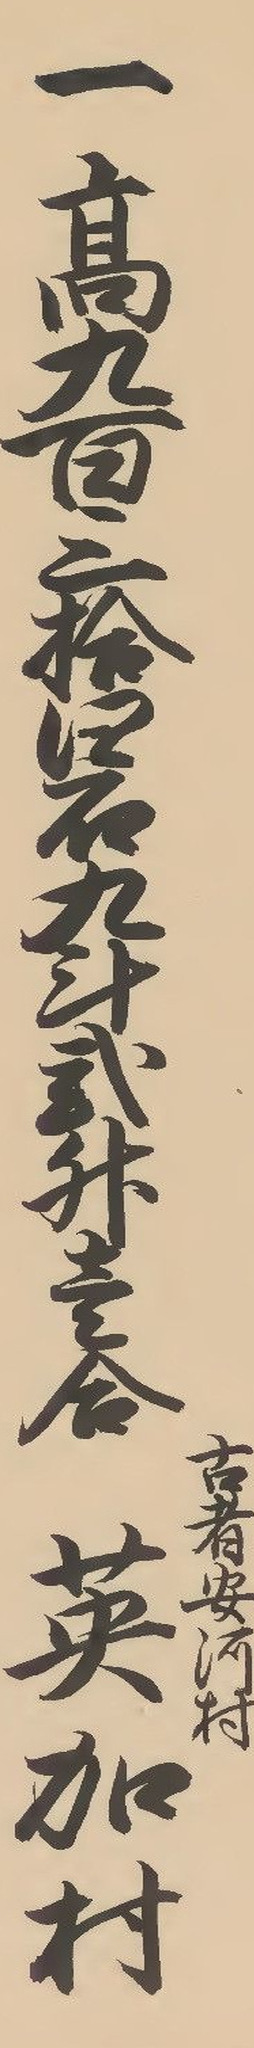一髙九百三拾四石九斗弐升壱合英加村
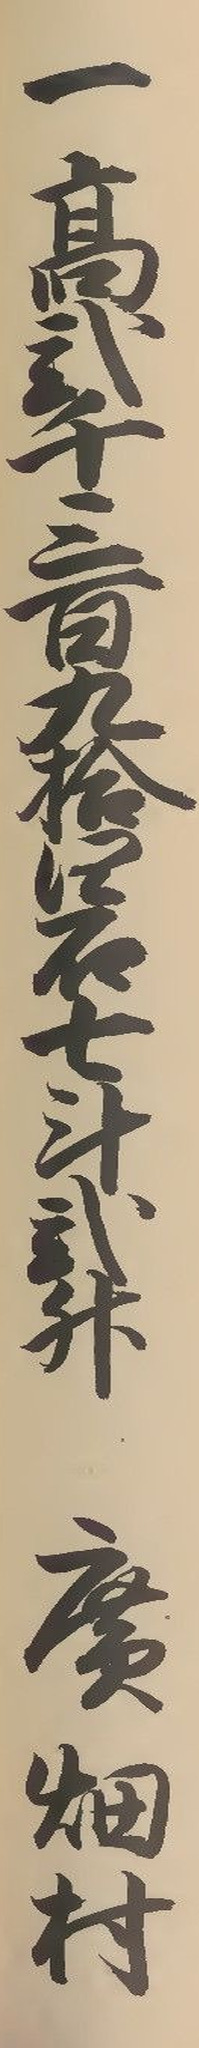一髙弐千三百九拾四石七斗弐升廣畑村
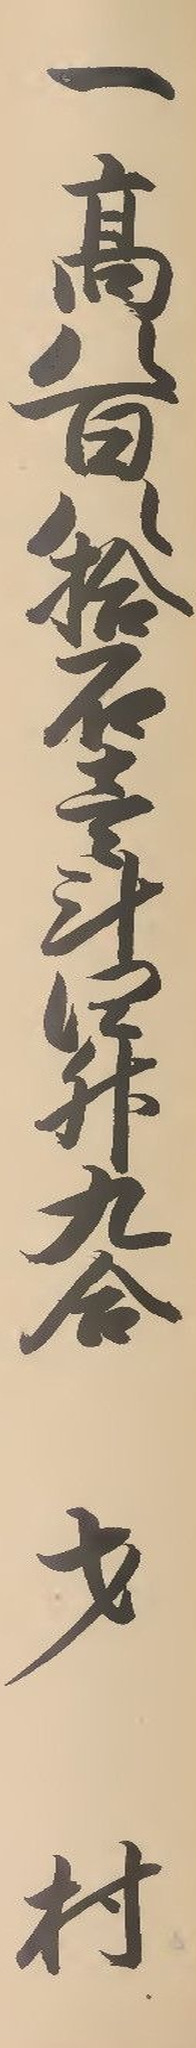一髙八百八拾石壱斗四升九合才村
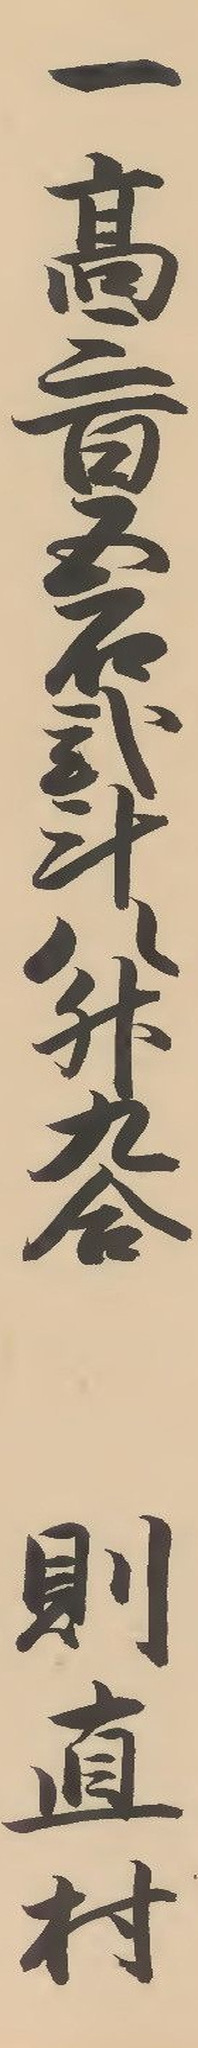一髙三百五石弐斗八升九合則直村
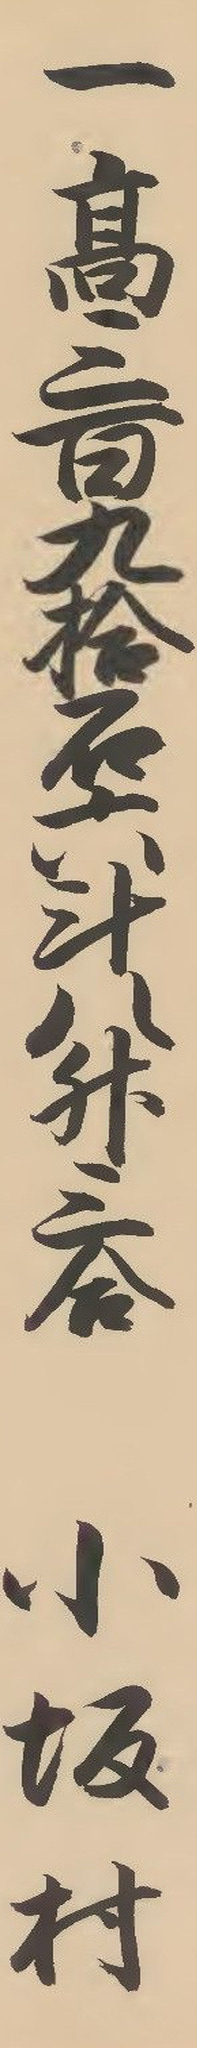一髙三百九拾石六斗八升三合小坂村
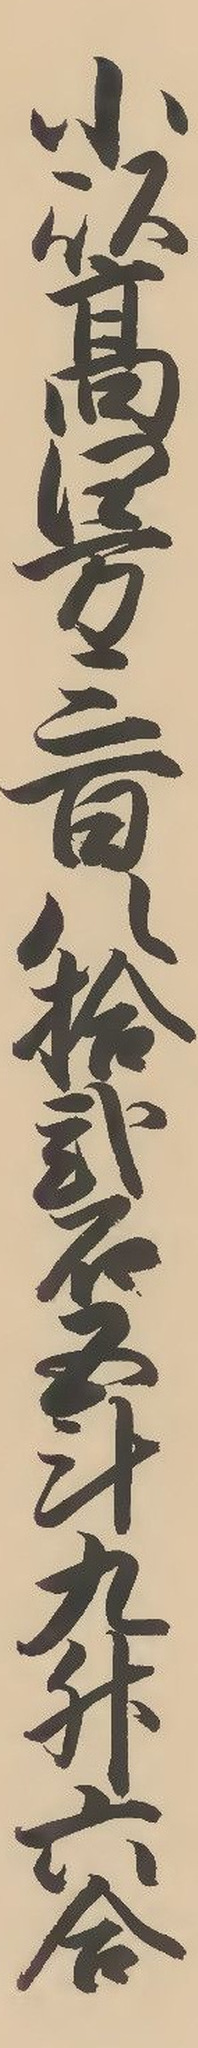小以髙四万三百八拾弐石五斗九升六合

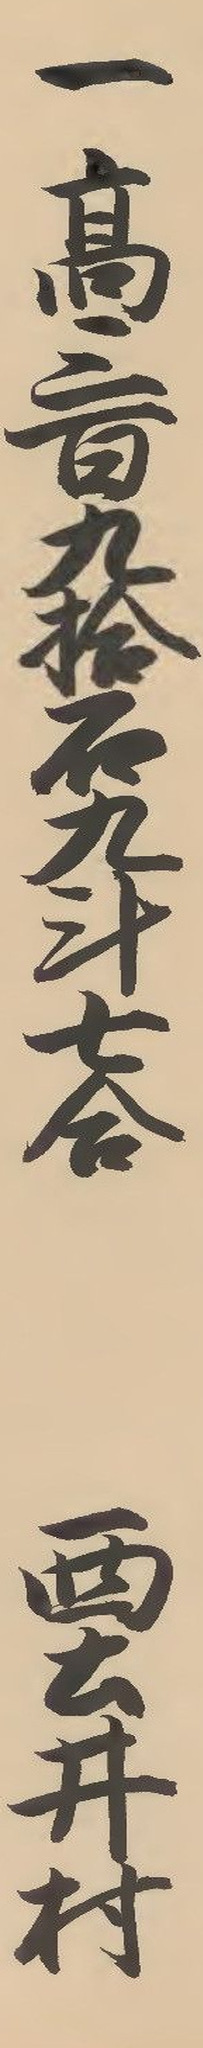一髙三百九拾石九斗七合西土井村
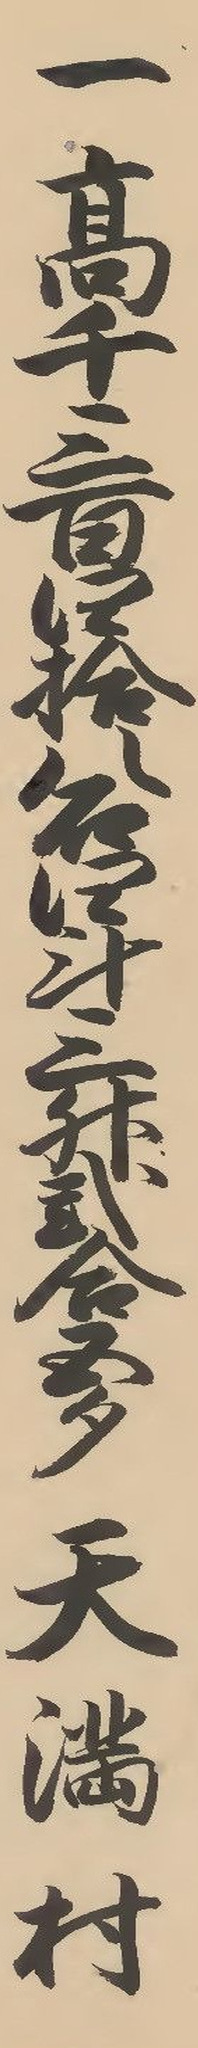一髙千三百四拾八石四斗三升弐合五勺天満村
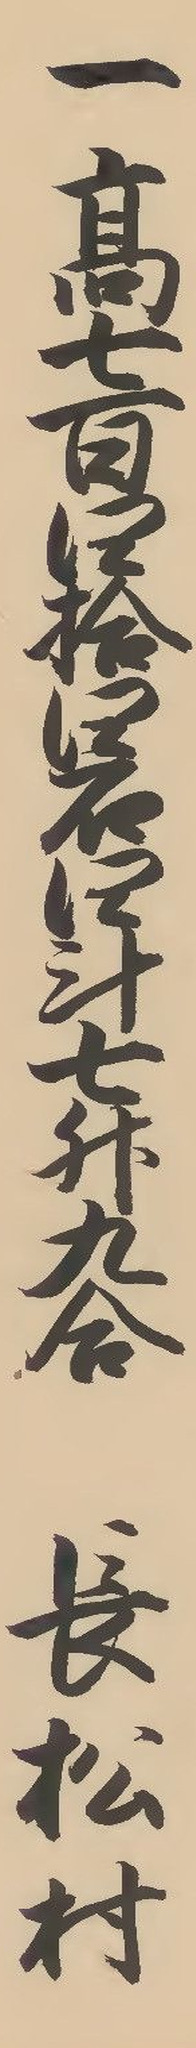一髙七百四拾四石四斗七升九合長松村

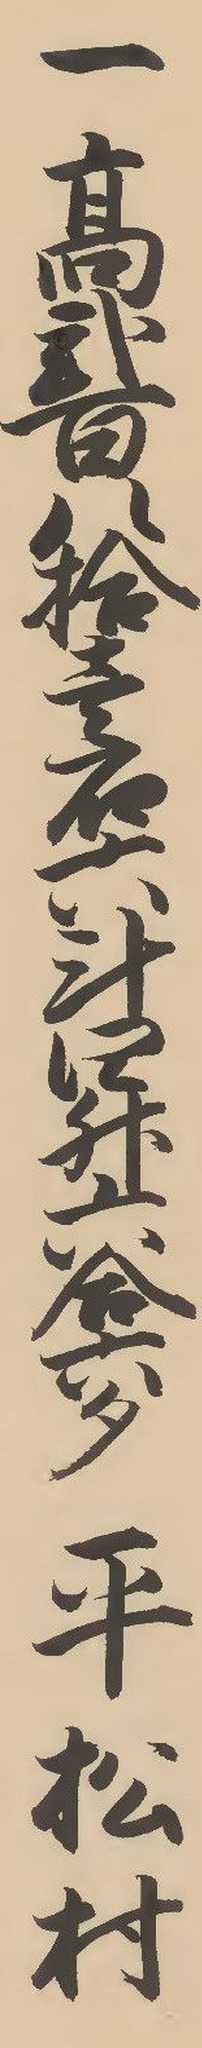一髙弐百八拾壱石六斗四升六合六勺平松村
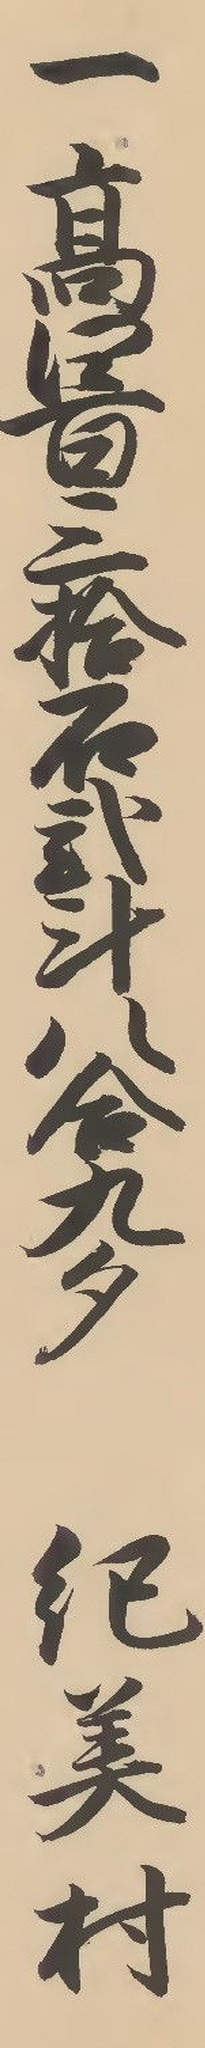一髙四百三拾石弐斗八合九勺紀美村
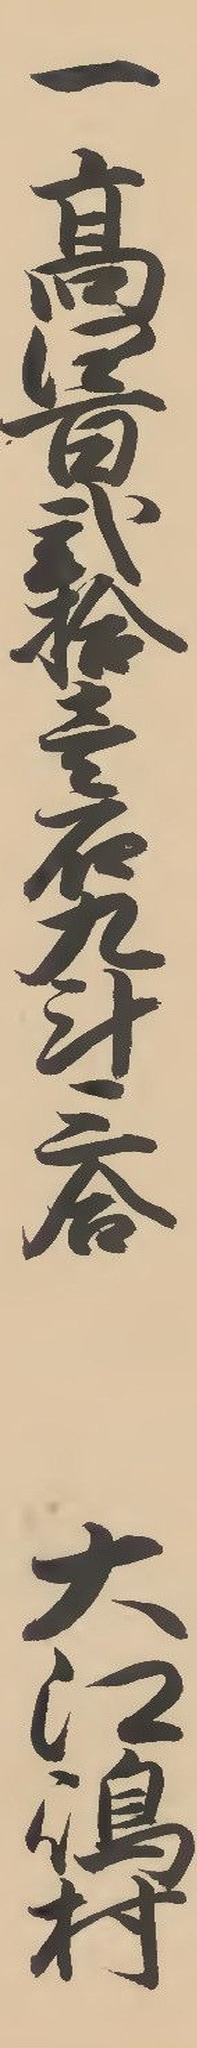一髙四百弐拾壱石九斗三合大江嶋村
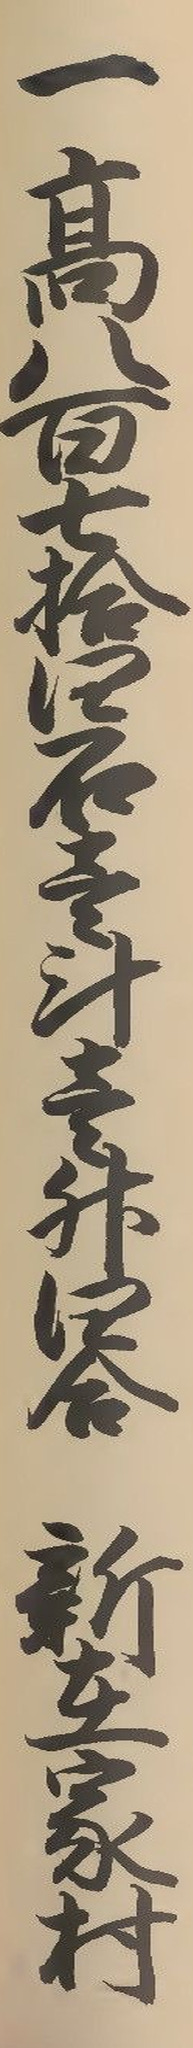一髙八百七拾四石壱斗壱升四合新在家村
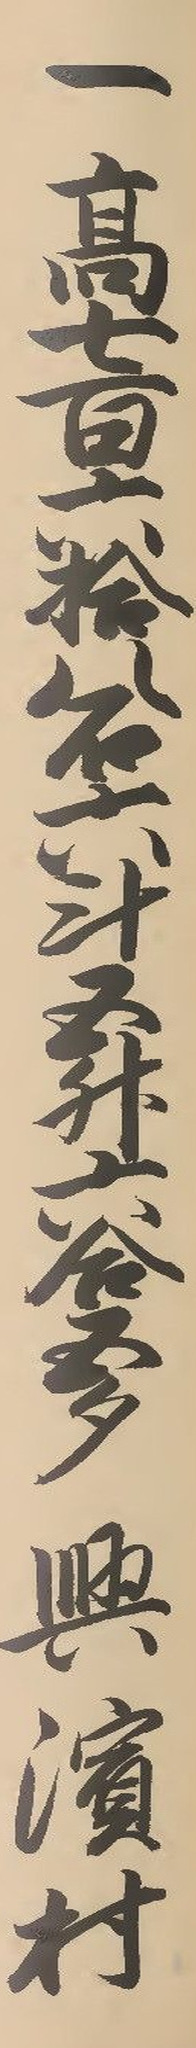一髙七百八拾八石六斗五升六合五勺興濱村
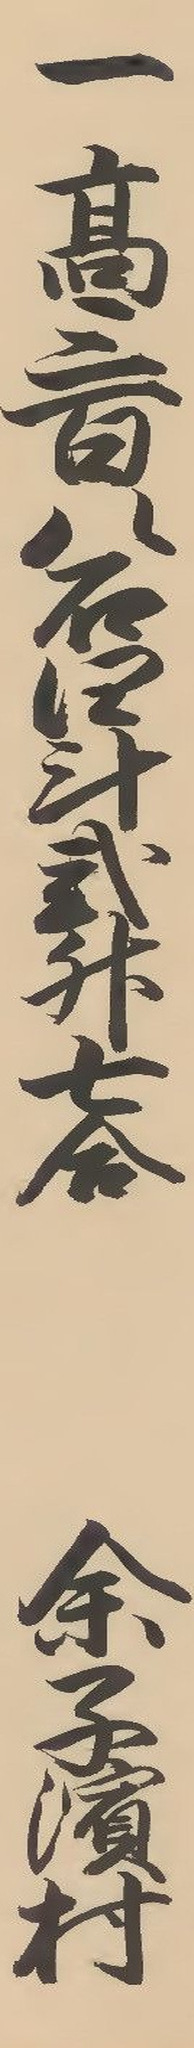一髙三百八石四斗弐升七合余子濱村
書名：播磨国郷帳
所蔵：国立公文書館 National Archives of Japan
